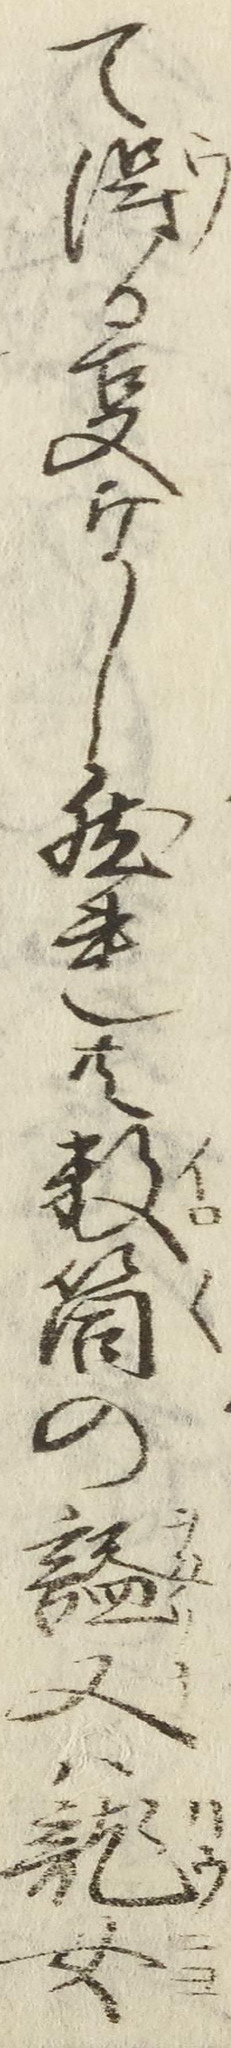て得る事なし然れ共数筒の謚又は龍女
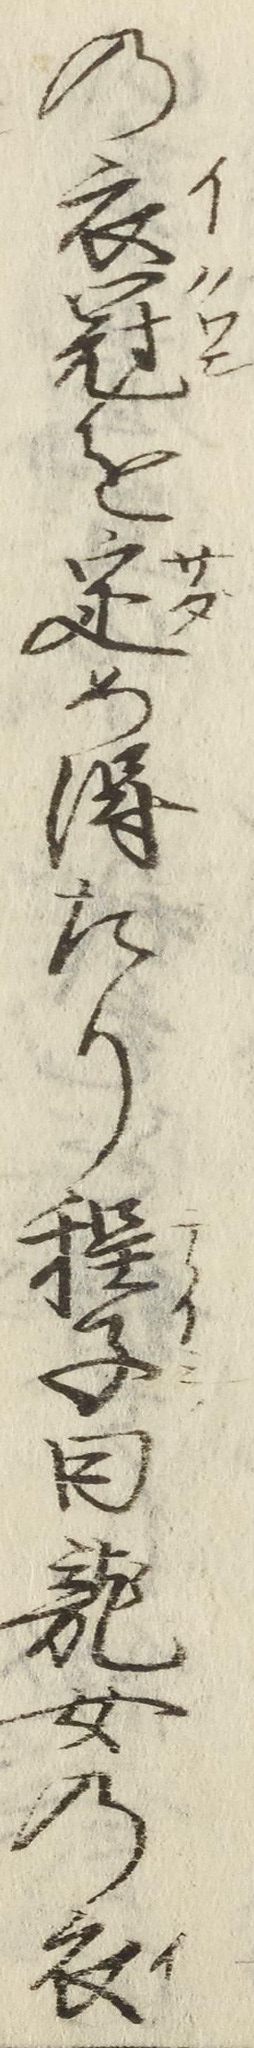の衣冠を定め得たり程子曰龍女の衣
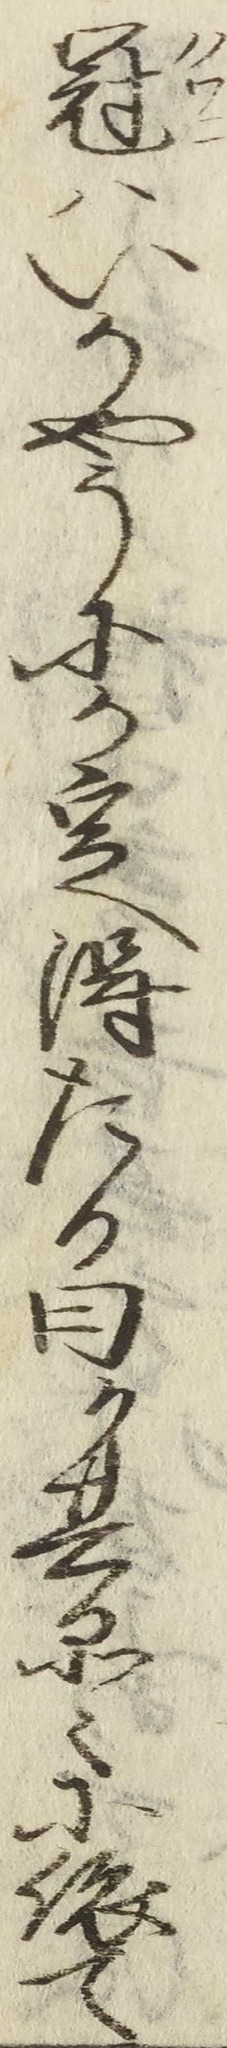冠はいかやうにか定得たる曰ク其品〻に依て

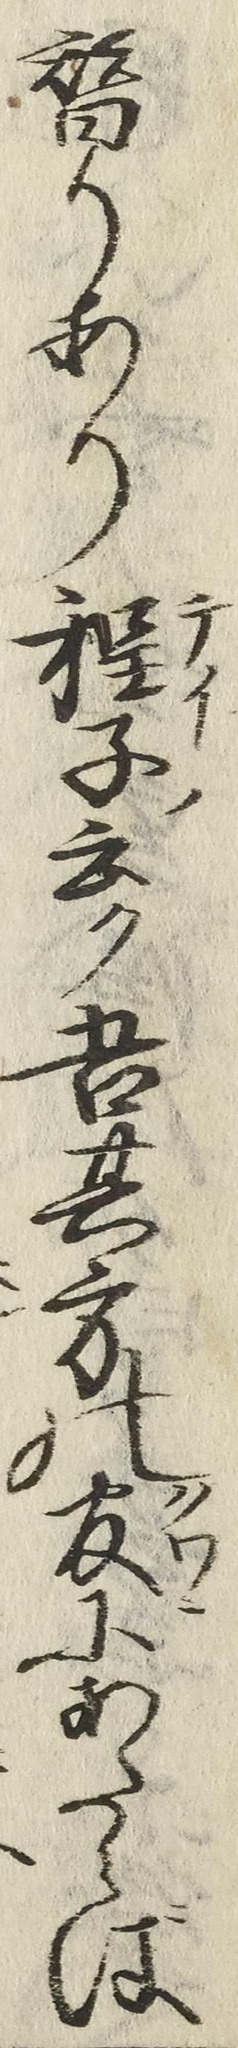替りあり程子ノ云ク吾其方の官にあたらば
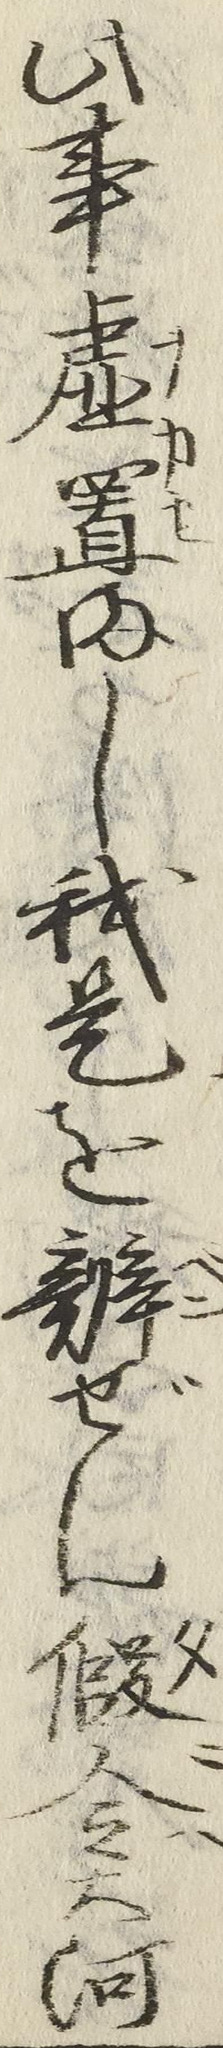此事虚置まし我是を辨ぜん仮令大河
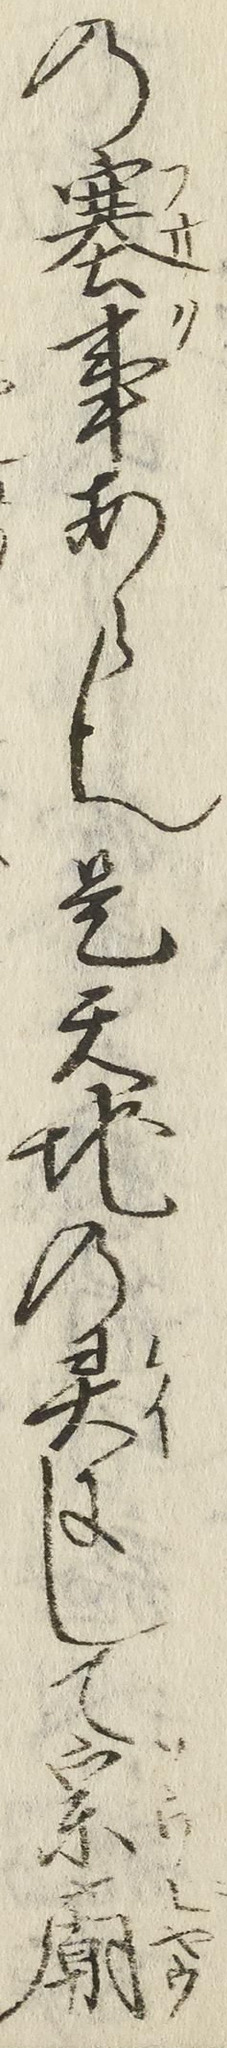の塞事あらん是天地の霊にして宗廟
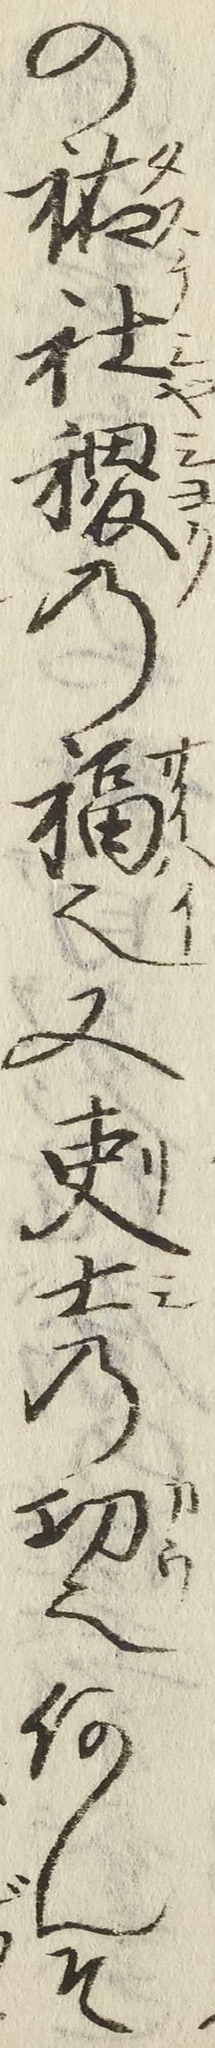の祐社稷の福也又吏士の功也何んそ
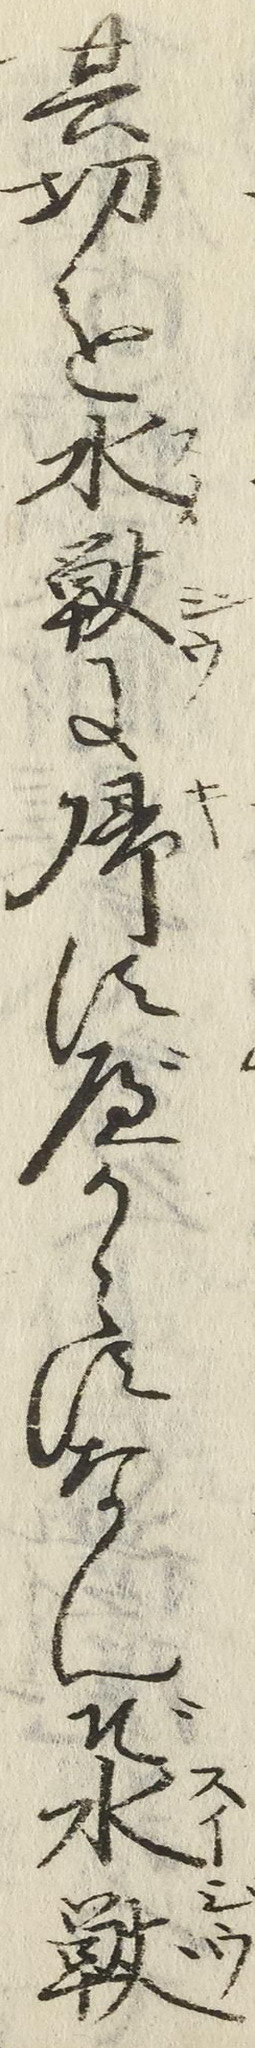其功を水獣に帰すべからすなんぞ水獣
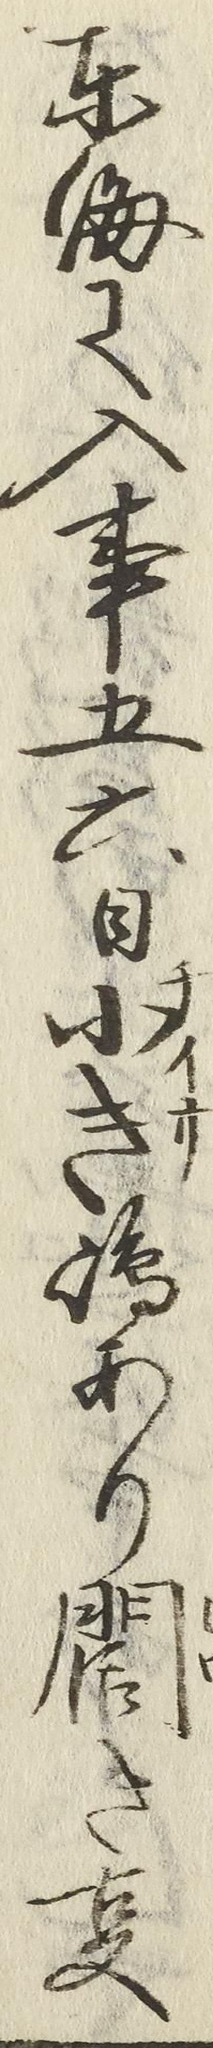東海に入事五六日小き嶋あり闊き事
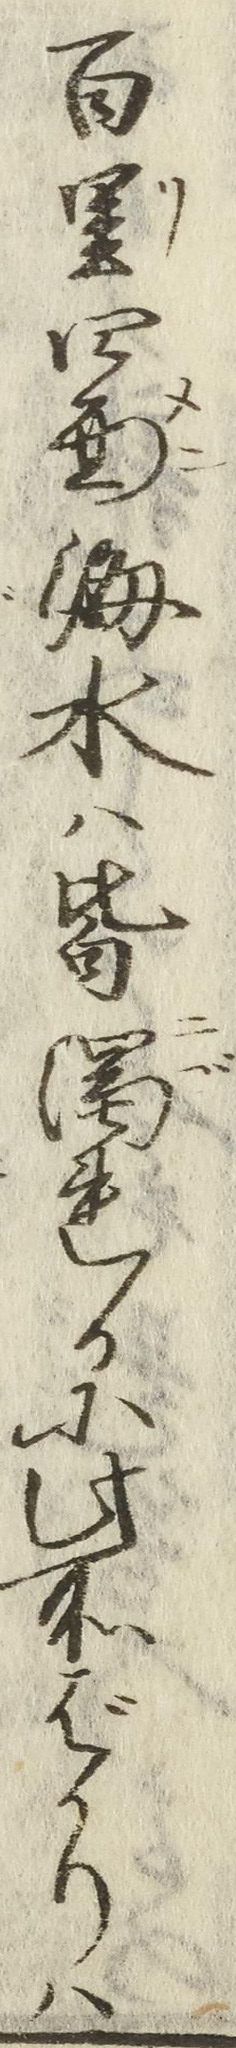百里四面海水は皆濁れるに此所ばかりは
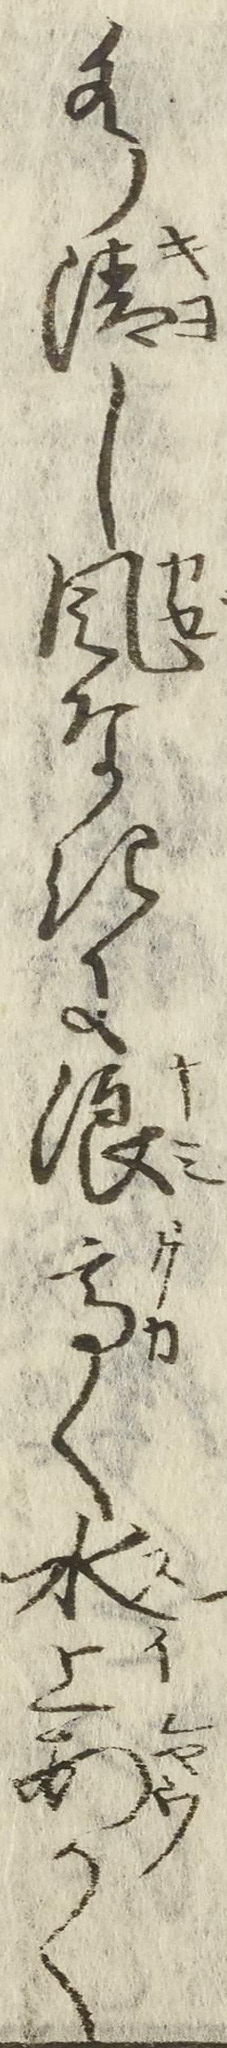水の清し風なきに浪高く水上あか〳〵
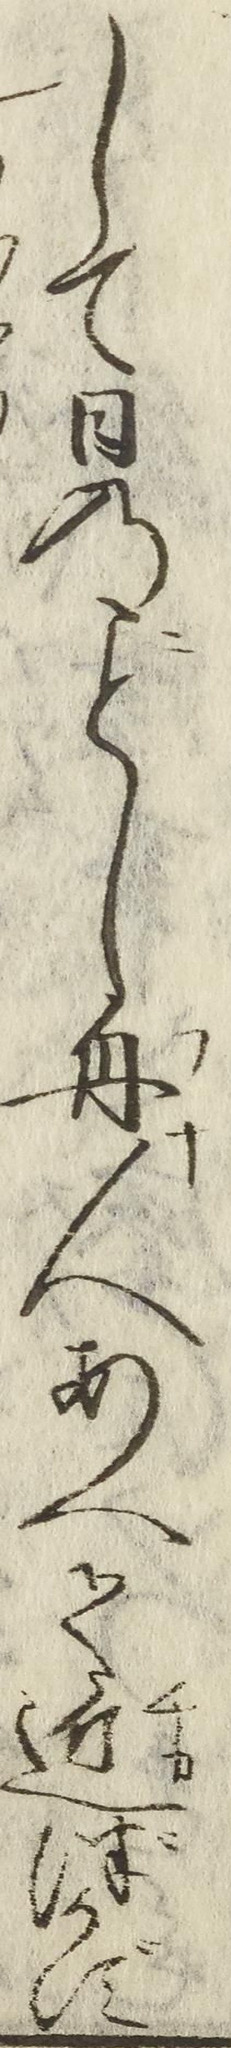して日のごとし舟人あへて近づかず
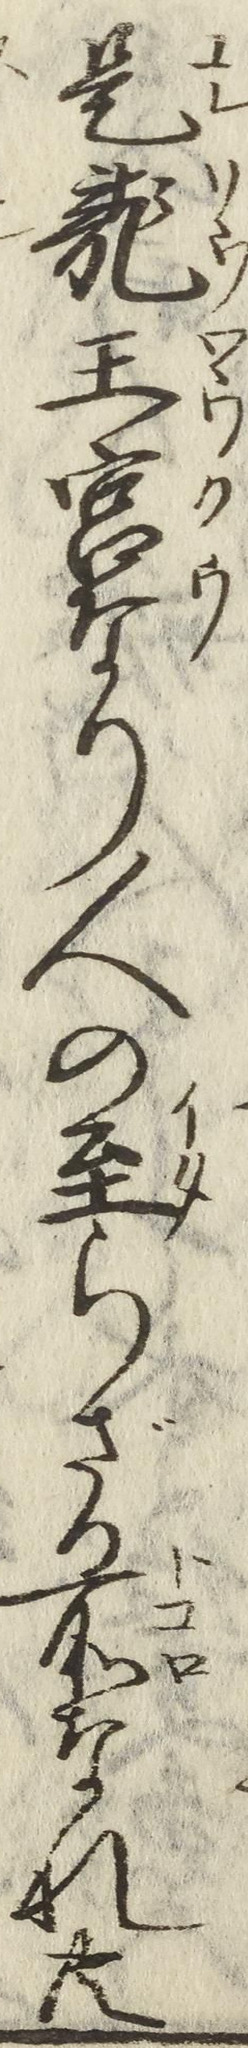是龍王宮なり人の至らざる所なれ共
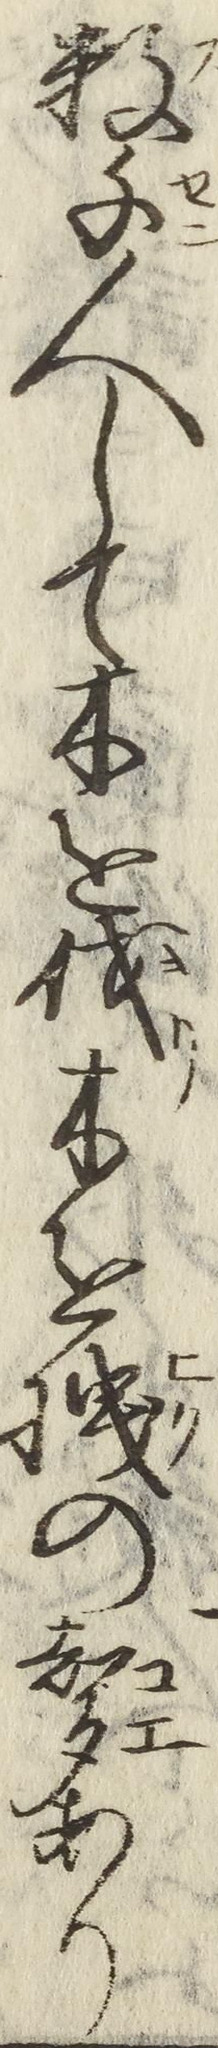数千人して木を伐木を拽の声あり
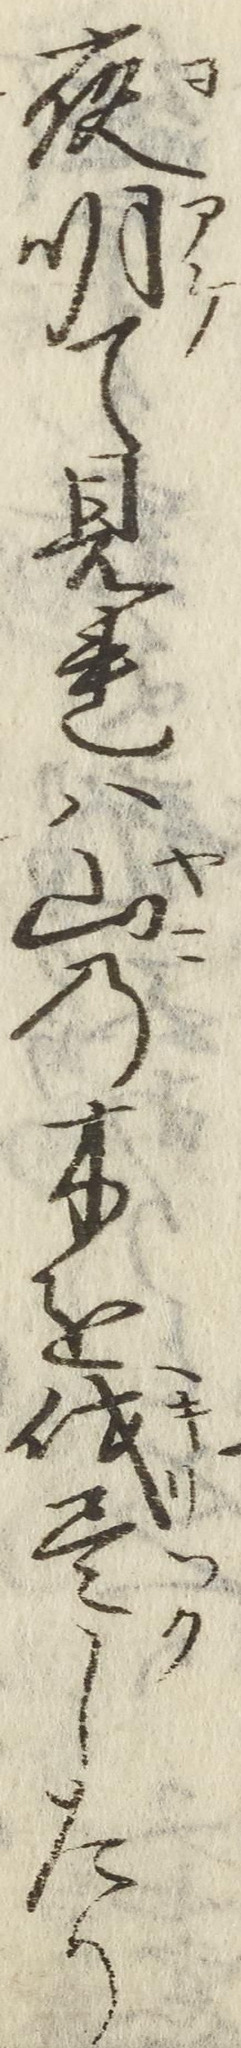夜明て見れは山の木を伐尽したり
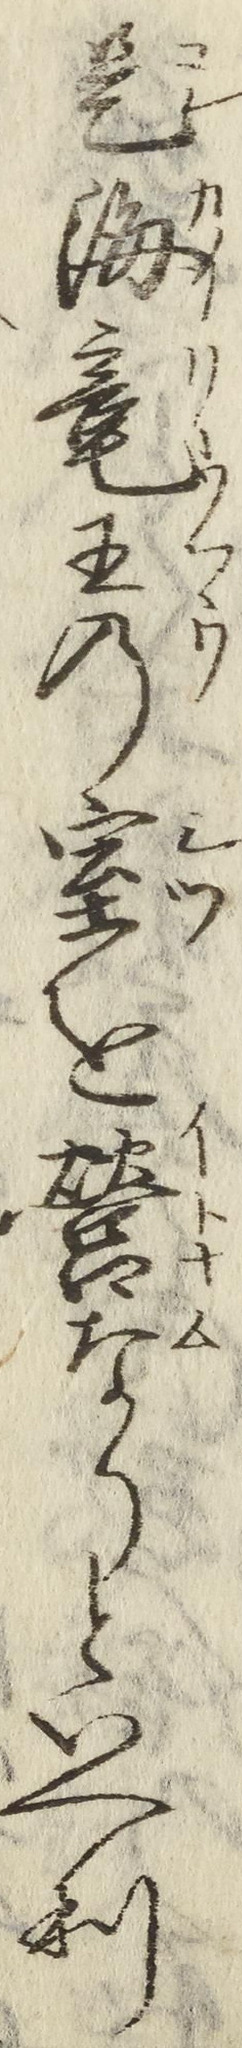是海竜王の室を営なりといへり
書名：天地或問珍　天
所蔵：東京大学地震研究所図書室 Earthquake Research Institute Library, The University of Tokyo, JAPAN
